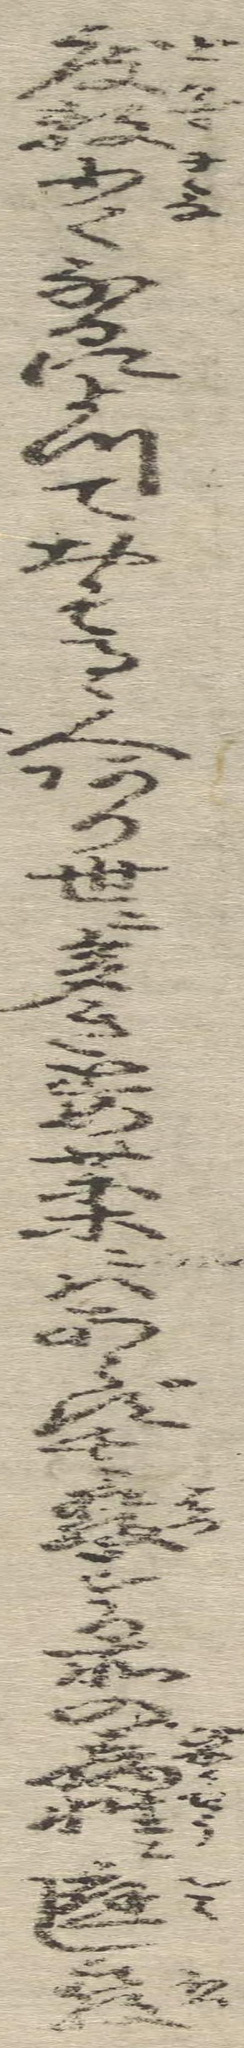度数少くなるによつておそるゝ人あり世に多きとめ薬等にはあらず其発する所の病性に応し発
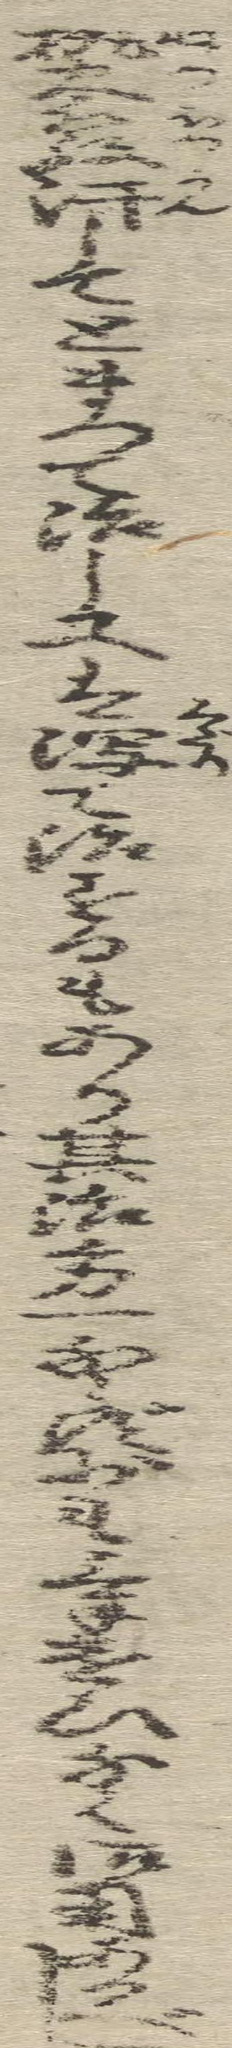熱発汗してとまつて治し又は瀉て治するもあり其治方一ならず少も気遣ひなく御用あるべし
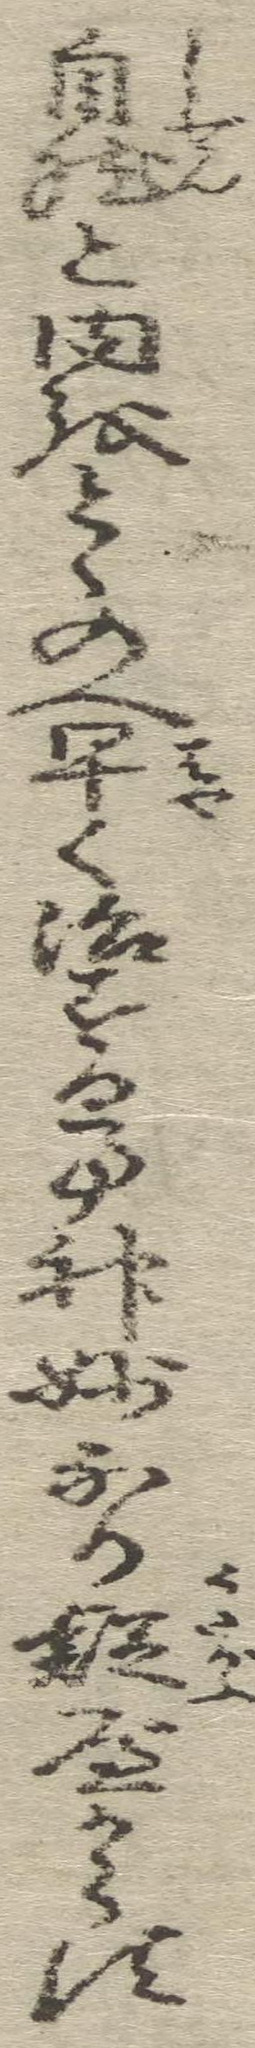自然と内をとゝのへ早く治する事神妙なり疑べからず
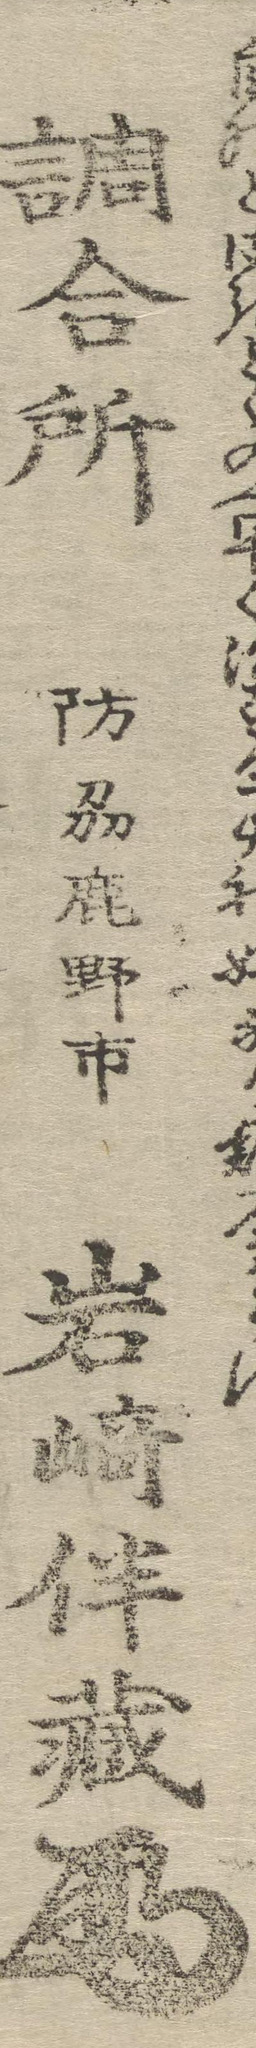調合所防州鹿野市岩崎伴蔵
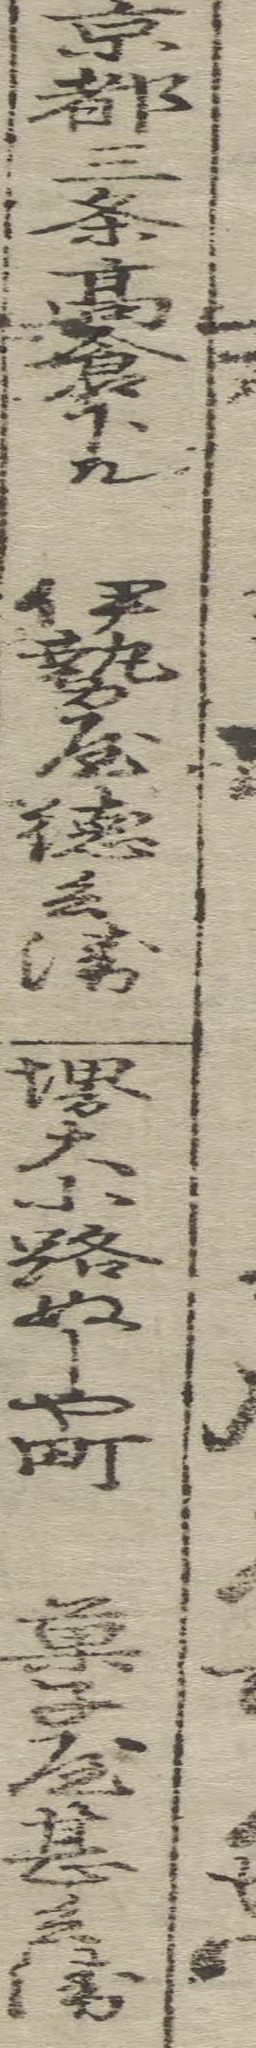京都三条高倉下ル伊勢屋徳兵衛堺大小路ぬしや町菓子屋甚兵衛
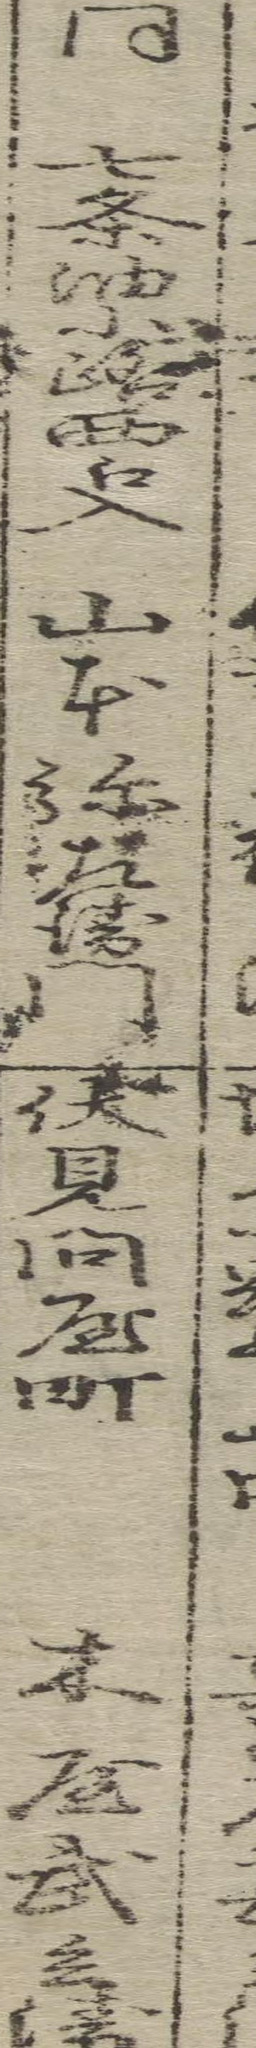同七条油小路西え入山本弥左衛門伏見問屋町木屋武兵衛
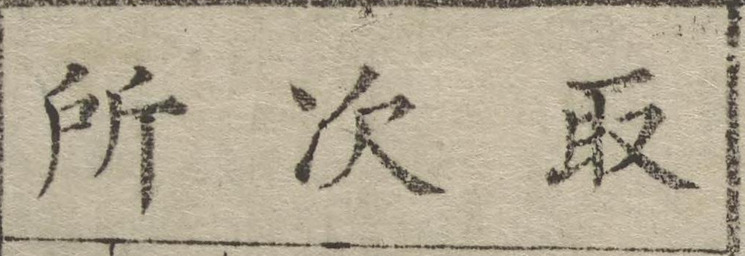取次所
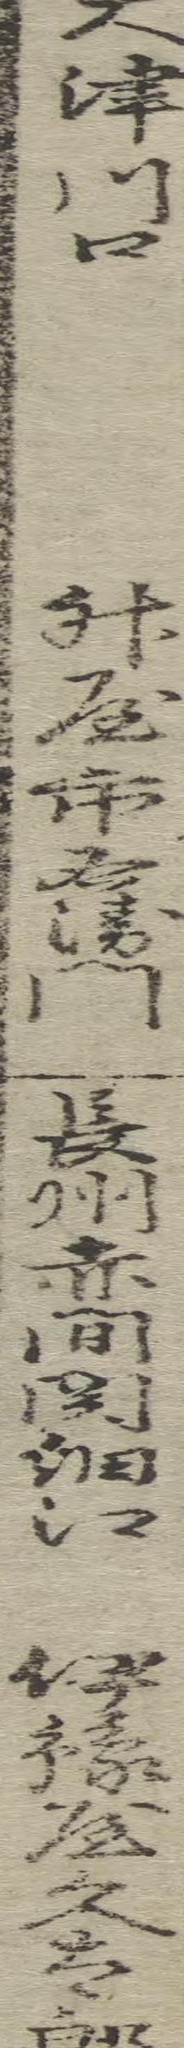大津川口舛屋市右衛門長州赤間関細江伊予屋久太郎
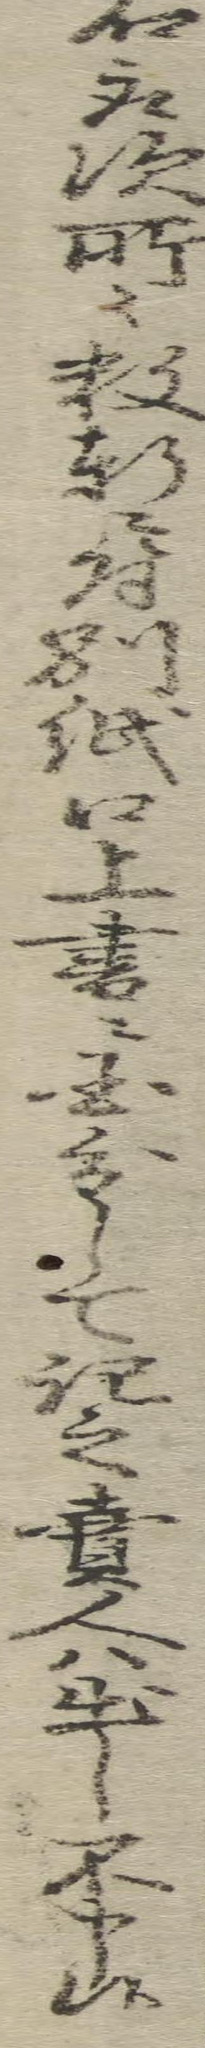右取次所は数軒に付別紙口上書に国分して記之売人は出し不申候

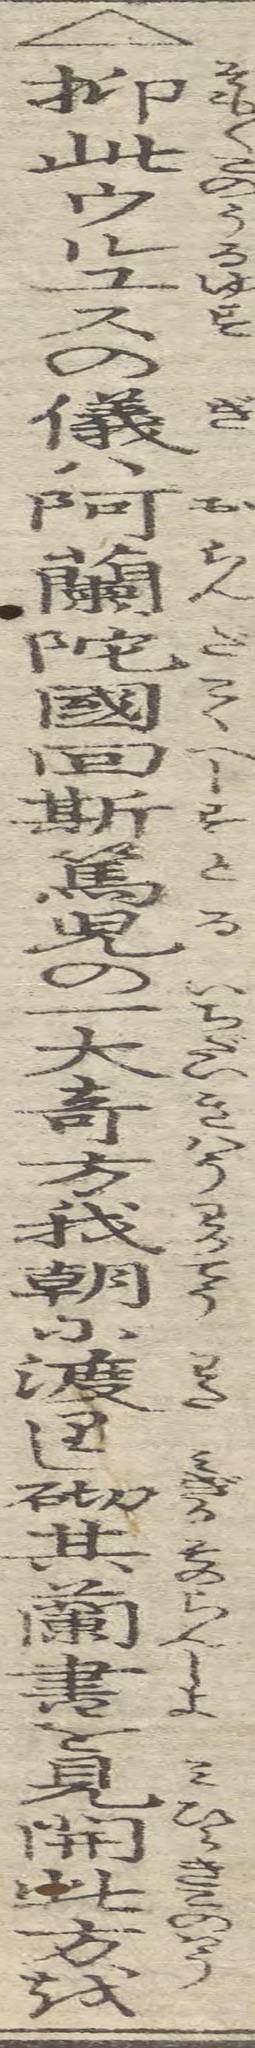△抑此ウルユスの儀は阿蘭陀国回斯篤児の一大奇方我朝に渡りし砌其蘭書を見開此方を
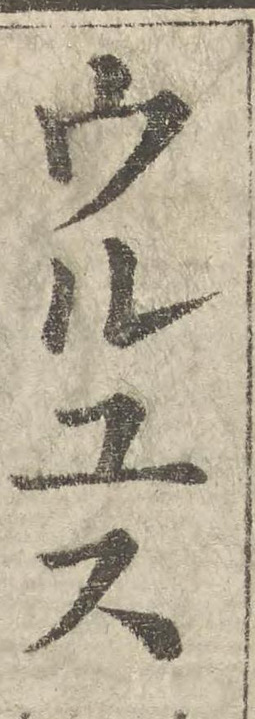ウルユス
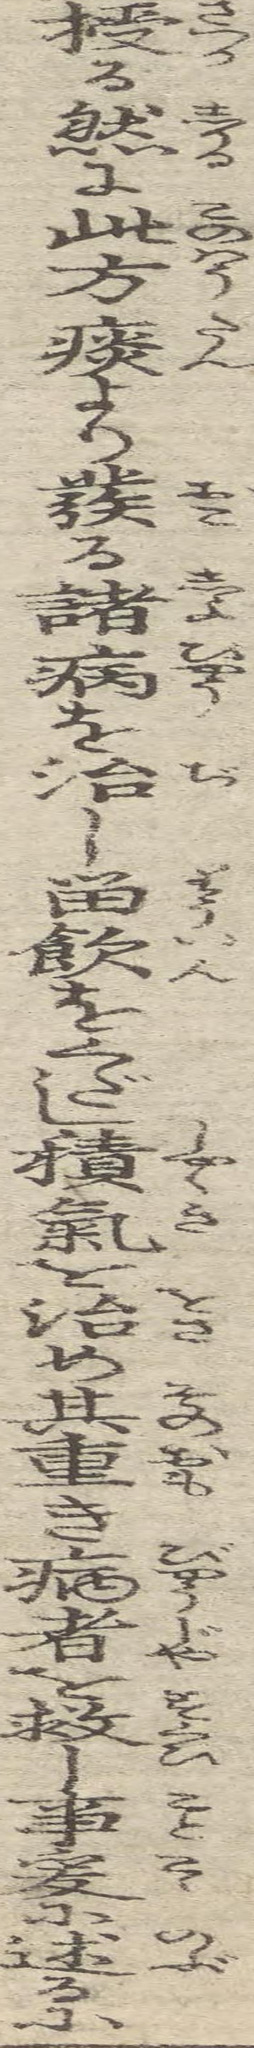授る然に此方痰より発る諸病を治し留飲をくだし積気を治め其重き病者を救し事爰に述るに
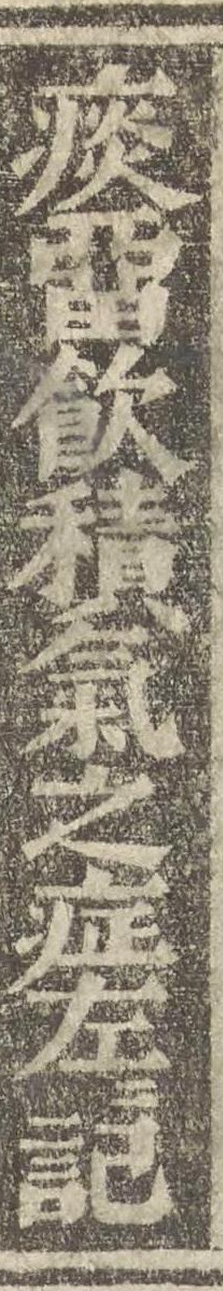痰留飲積気之症左に記
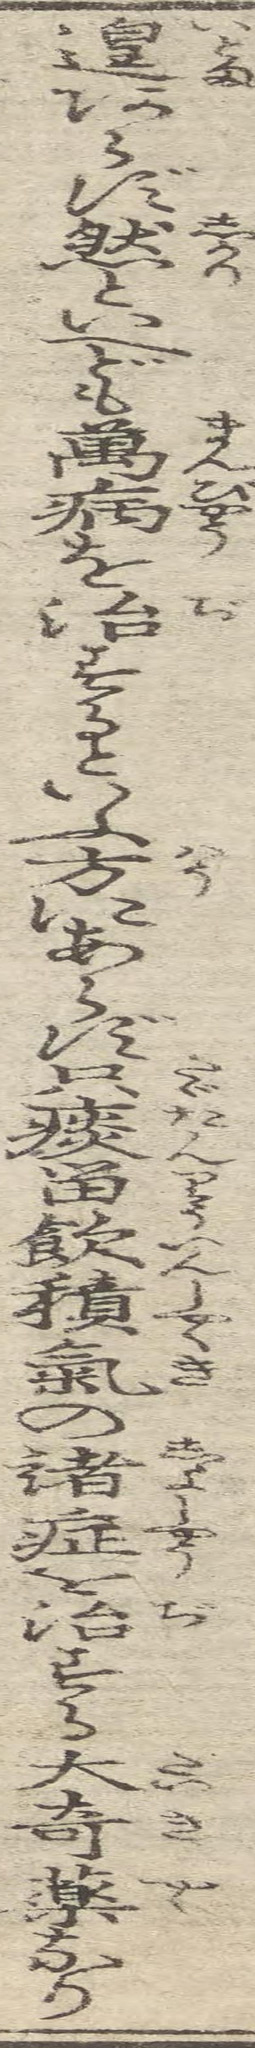遑あらず然といへども万病を治するといふ方にあらず只痰留飲積気の諸症を治する大奇薬なり
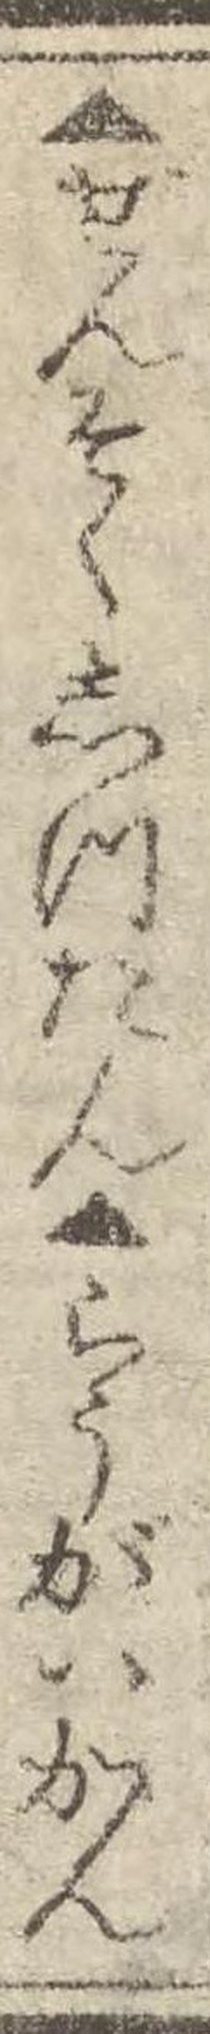▲ぜんそくしつたん▲らうがいかん
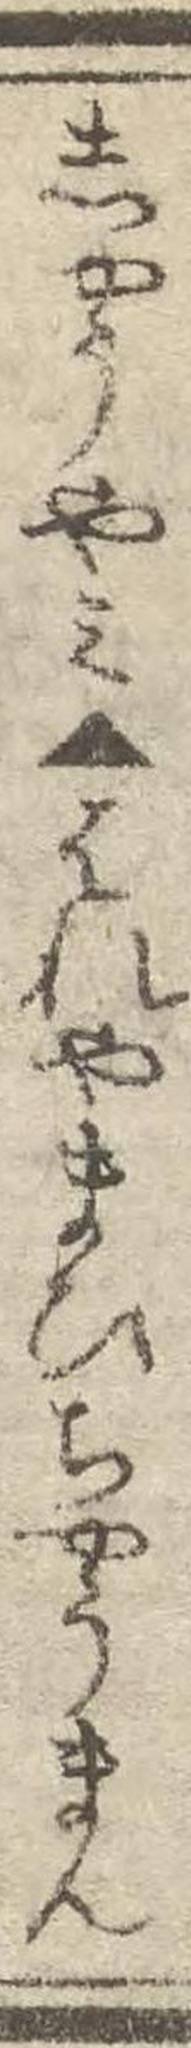しやうやみ▲はれやまひちやうまん
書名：浪華薬種問屋能書張交帖. 一
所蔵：国立国会図書館 National Diet Library, JAPAN
